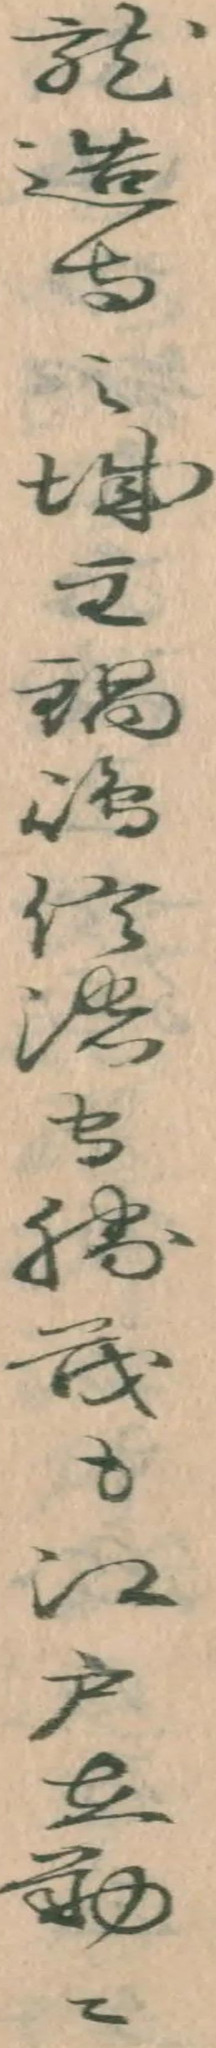龍造寺之城主鍋島信濃守勝茂も江戸在勤に
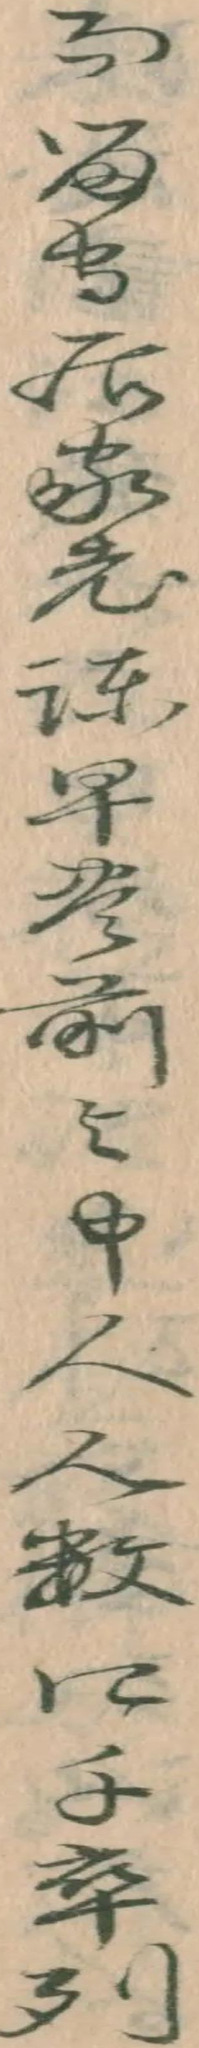而留守居家老諌早豊前与申人人数四千卒列
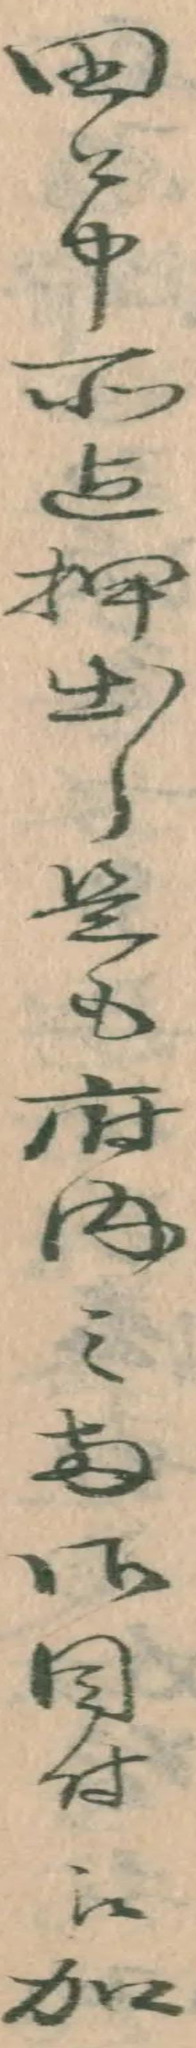田と申所迄押出し是も府内之両御目付江加
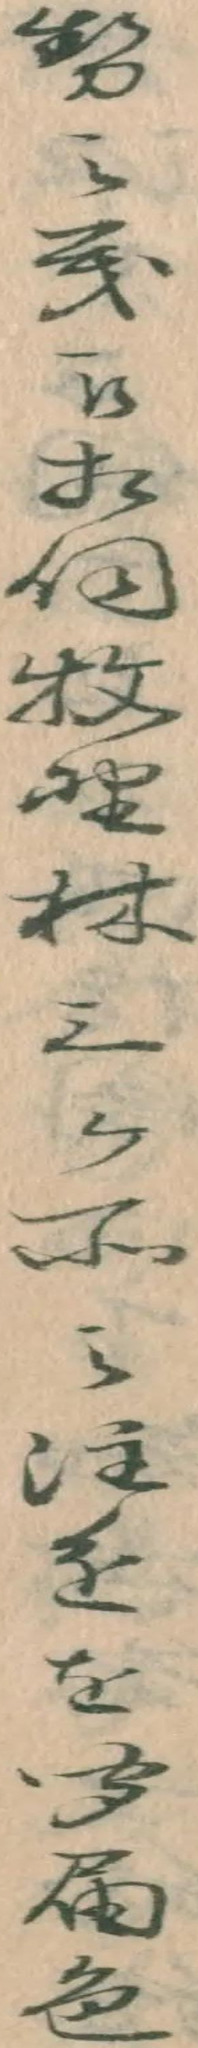勢之義江相伺牧野村三ケ所之注進を聞届色
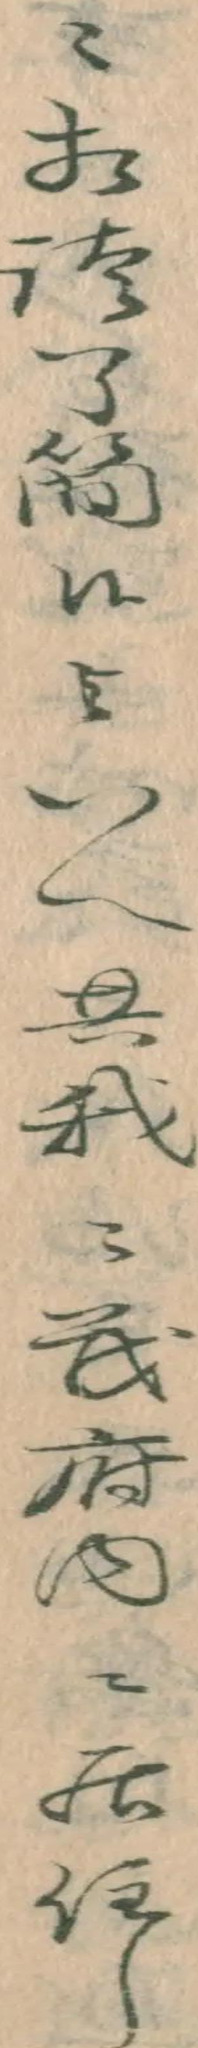々相談了簡候与いへ共我々茂府内に居住し
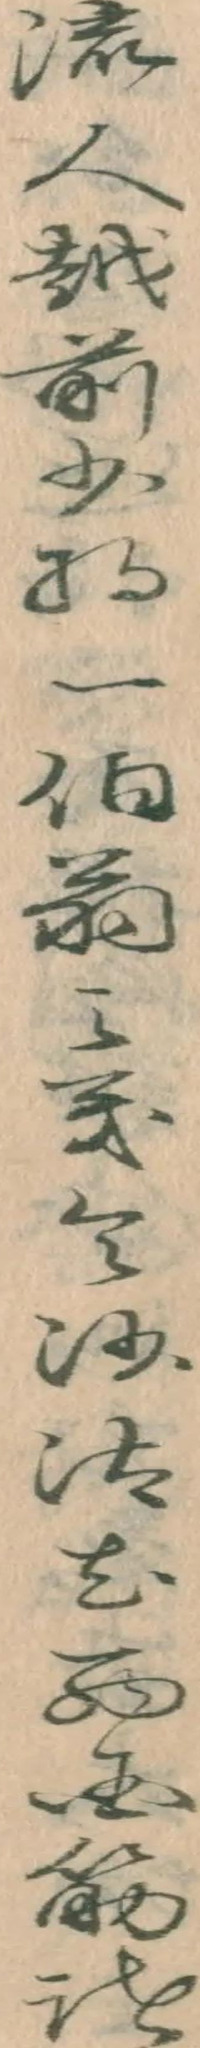流人越前少将一伯翁之義令沙汰尤西国筋諸
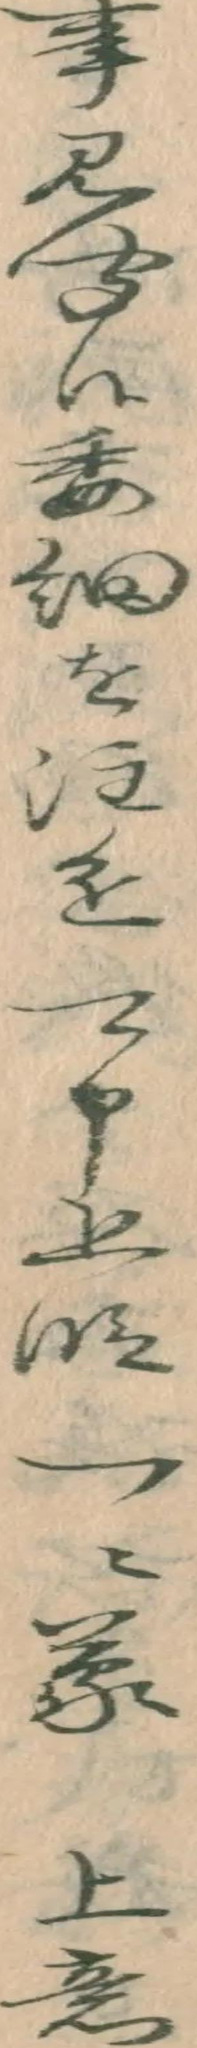事見聞候委細を注進可申上段一に承上意
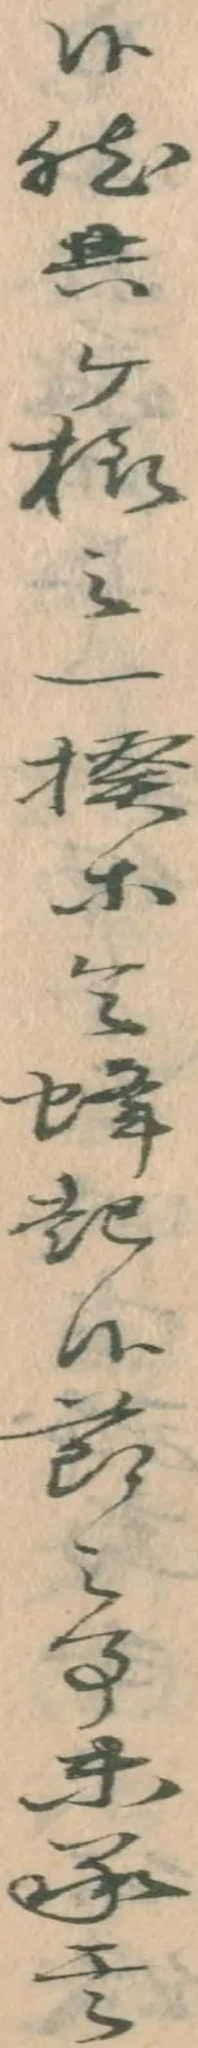候然共け様之一揆等令蜂起候節之事未承其
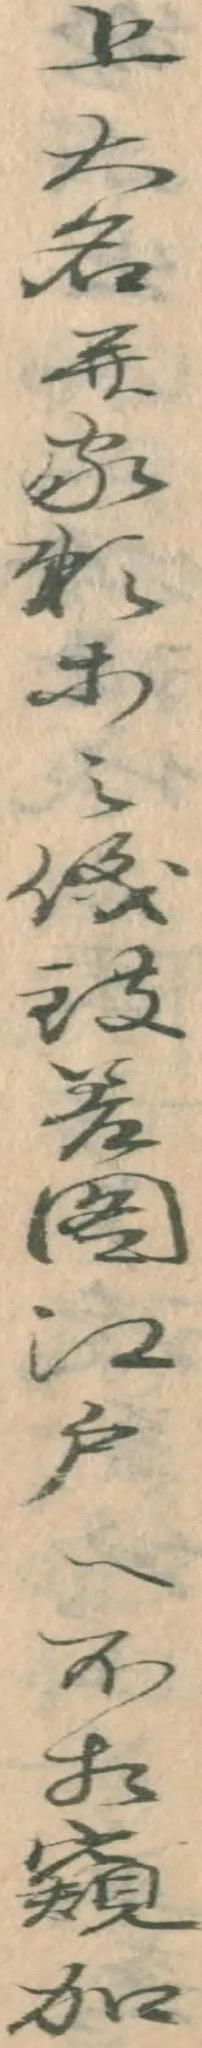上大名幷家数等之儀致差図江戸へ不相窺加

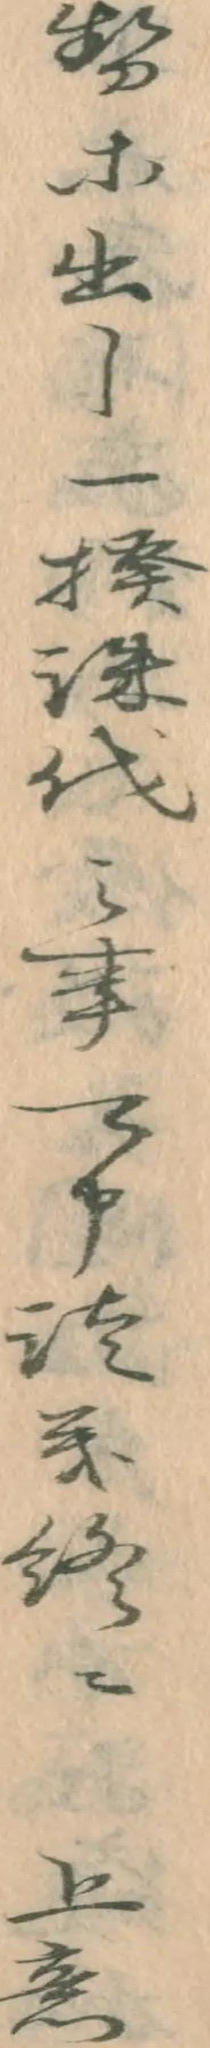勢等出し一揆誅伐之事可申談義終に上意
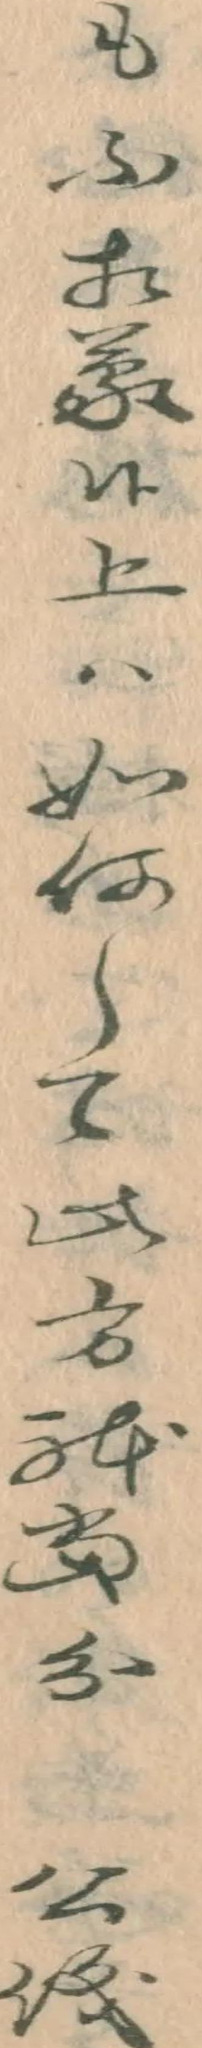もふ相承候上は如何して此方躰当分公儀
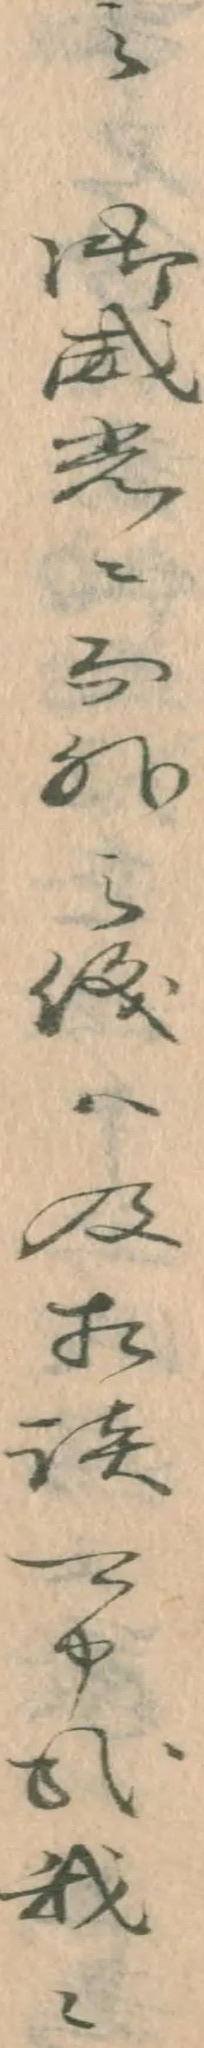之御威光に而外之儀は及相談可申哉我に
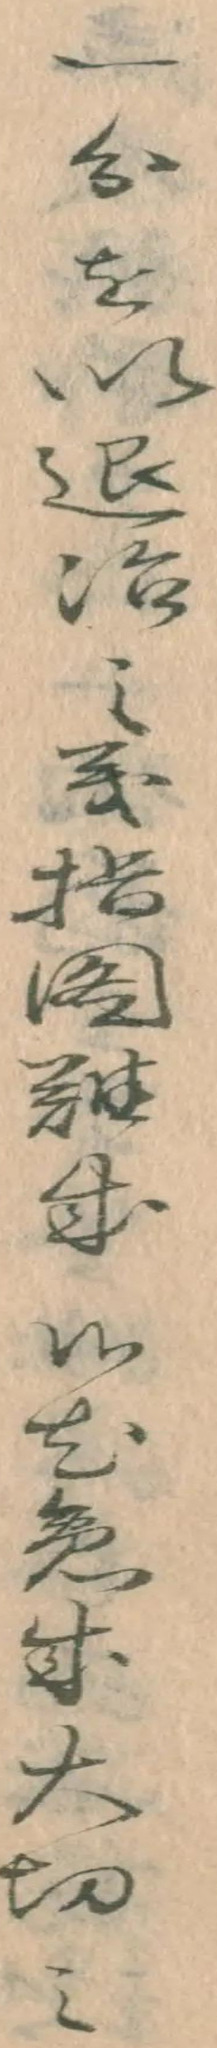一分を以退治之義指図難成候尤急成大切之
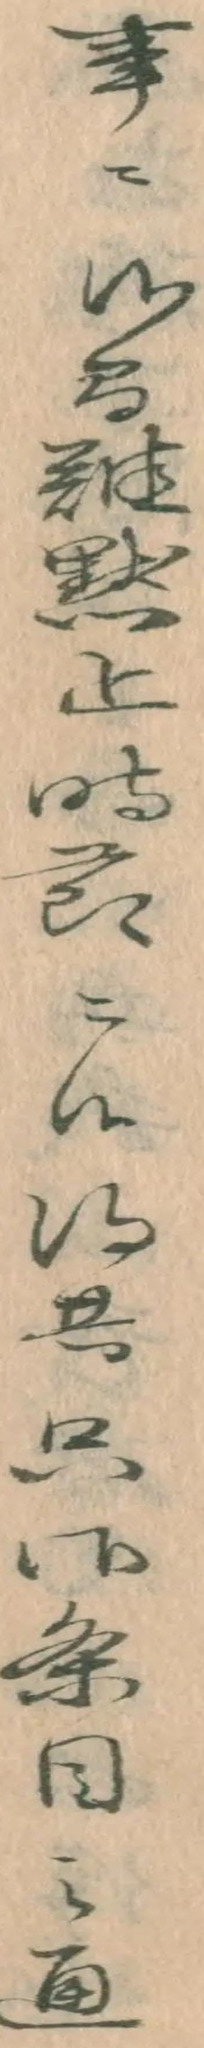事に候間難黙止時節に候得共只御条目之通
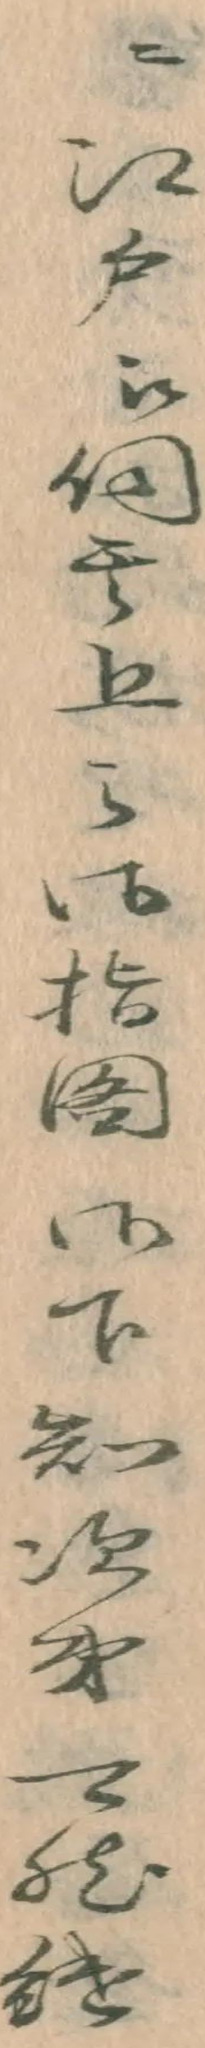に江戸江伺其上之御指図御下知次第可然鑓
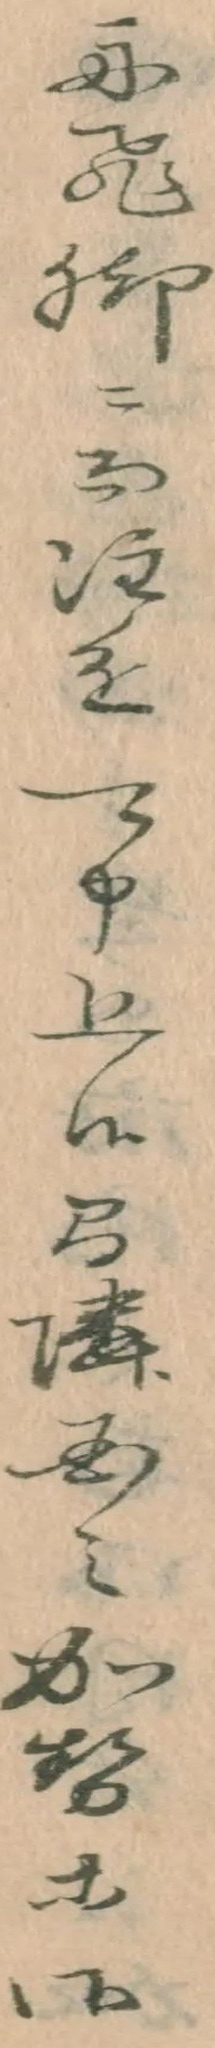舟飛脚に而注進可申上候間隣国之加勢等御
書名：切支丹御退治記 49巻. [2]
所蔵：国立国会図書館 National Diet Library, JAPAN
